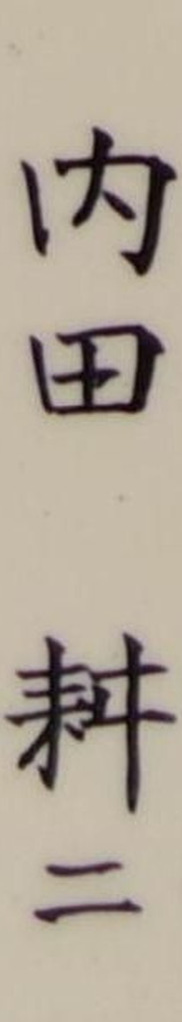内田耕二
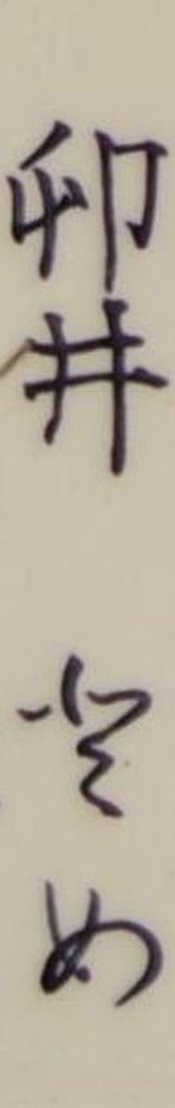卯井とめ
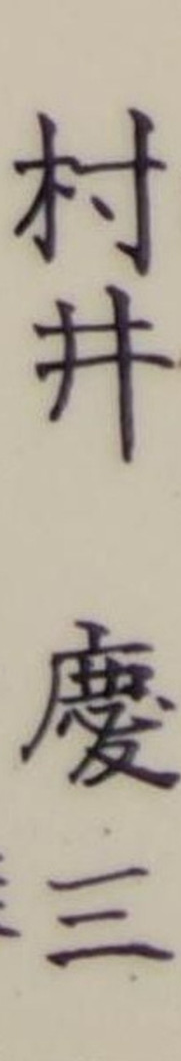村井慶三

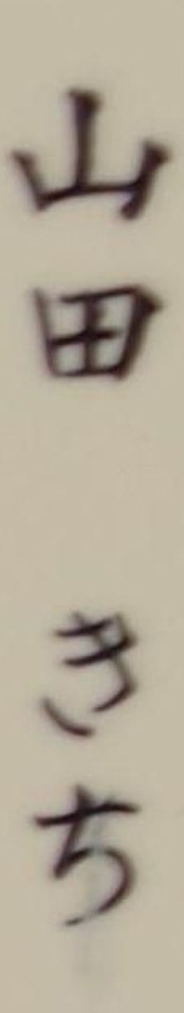山田きち
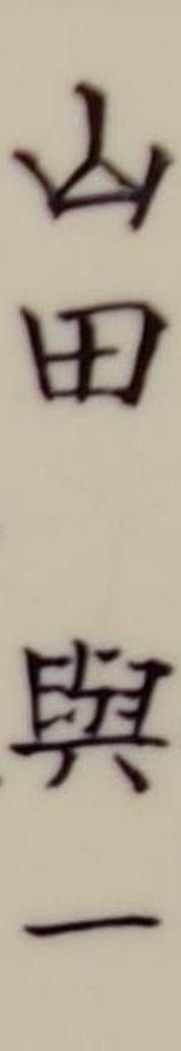山田與一
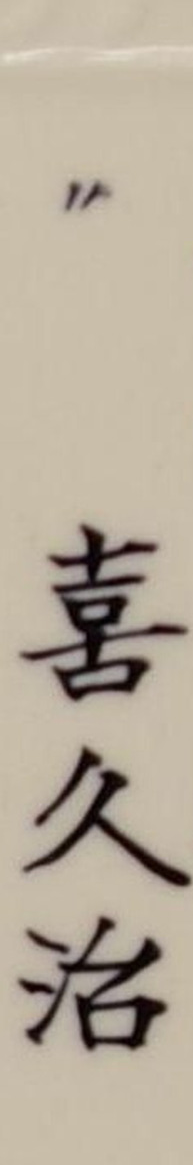喜久治
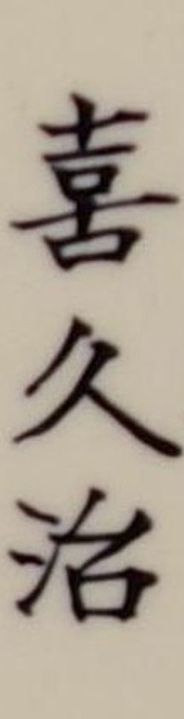喜久治
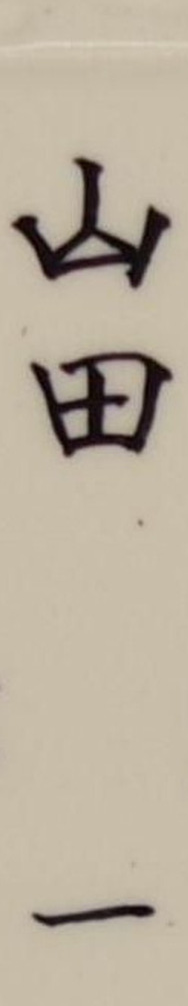山田一

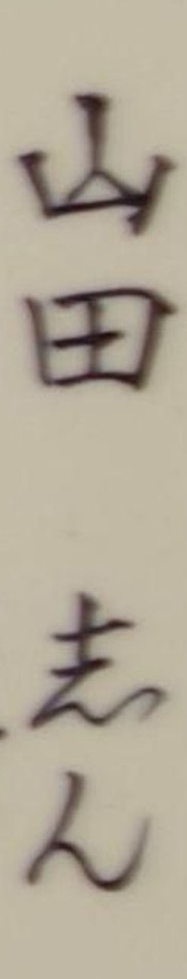山田しん
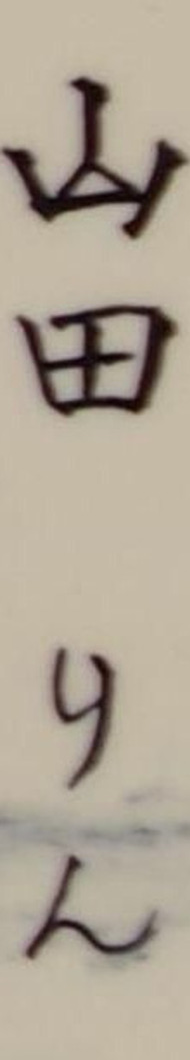山田りん
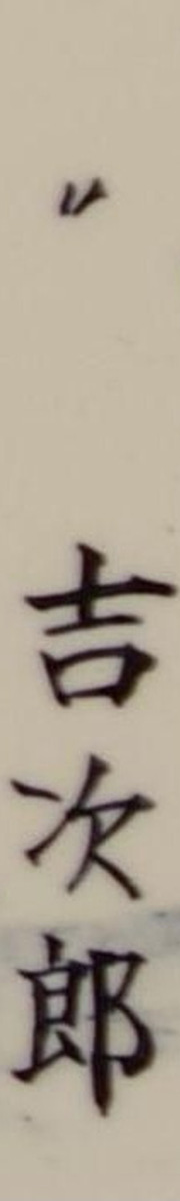吉次郎
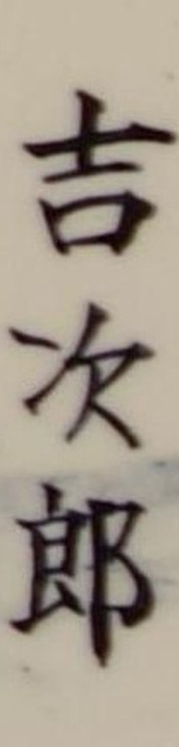吉次郎
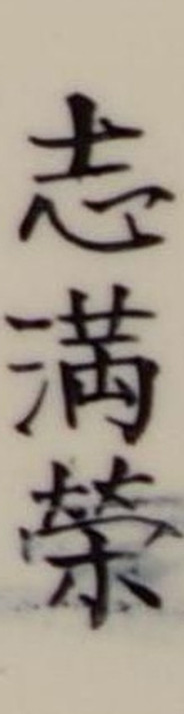志満榮
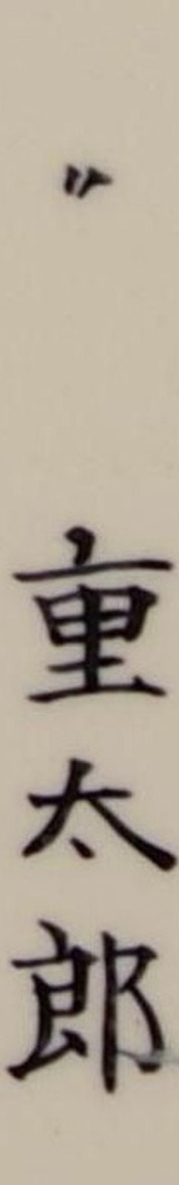重太郎
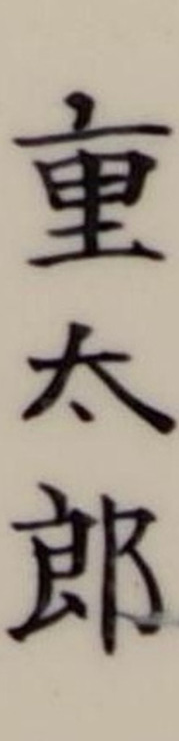重太郎
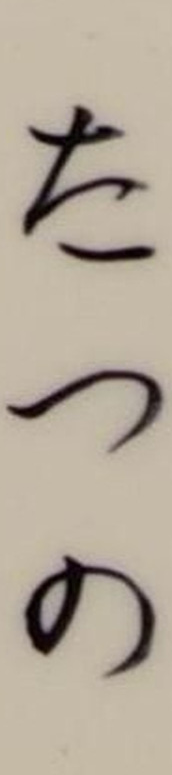たつの
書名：M~S
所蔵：高野山金剛峯寺
